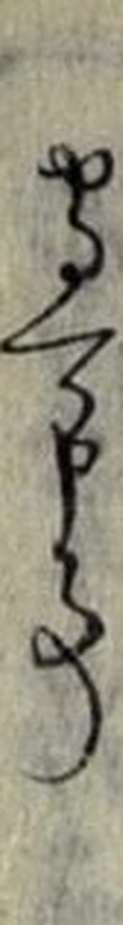守可申事
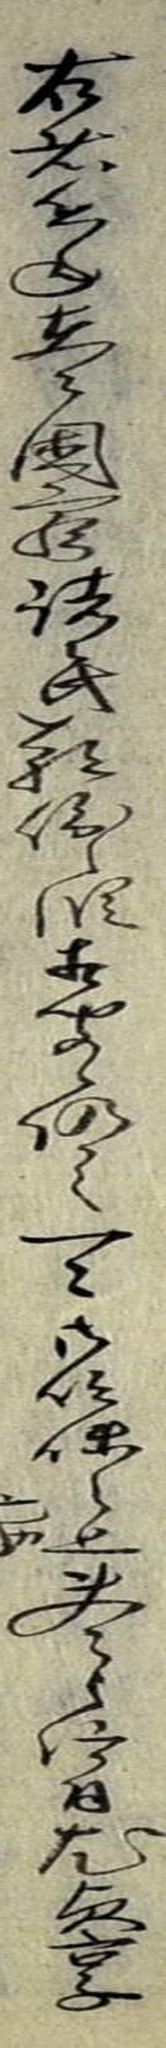右者近年在々困窮諸民難儀之段相聞候仍之一々御吟味之上夫々被仰付尤貞享
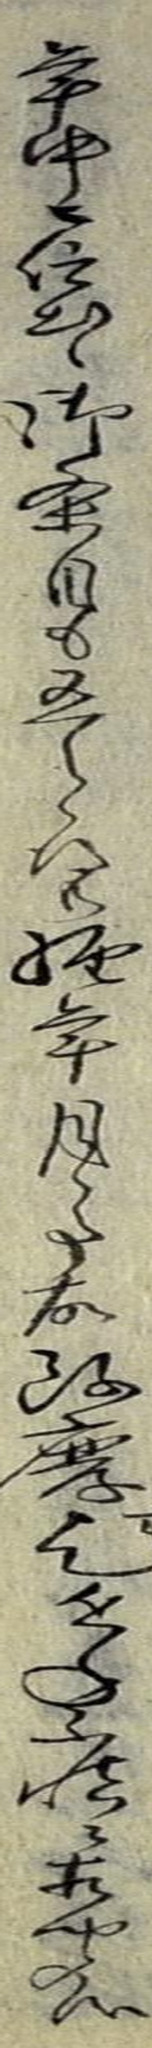年中ニ仰出候御条目も有之候得共経年月候事故致近年不慎ニ相聞候
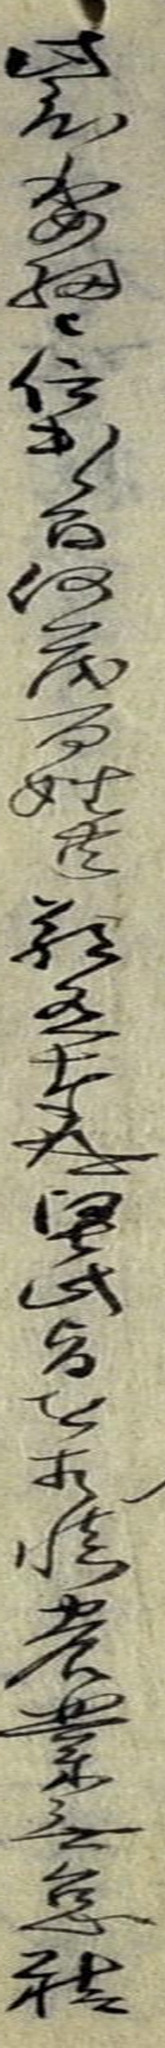此度委細被仰出候間何茂百姓共難有奉存堅此旨を相慎農業無怠精
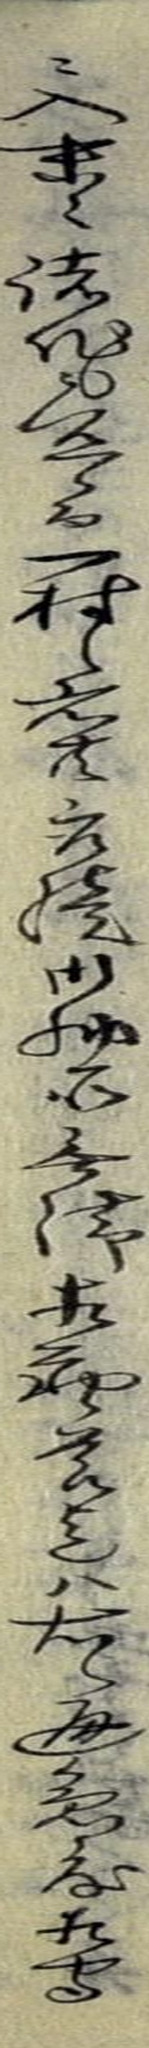ニ入末々諸作も宜候而一村之者共取続御納所無滞相勤候節迄ハ右之通急度相守
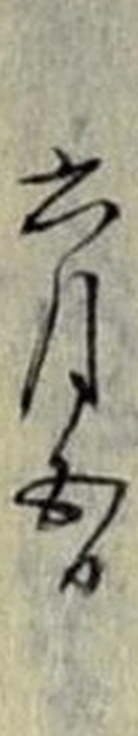六月五日
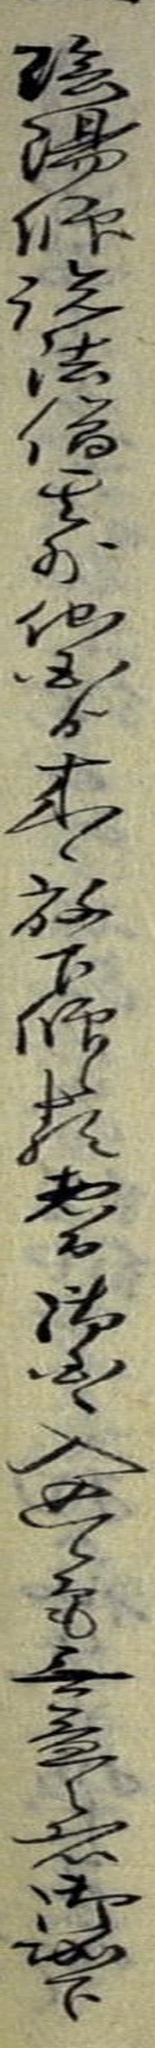一陰陽師説法僧其外他国ゟ来候放下師之類惣而御国へ入込候而も無益之者御城下
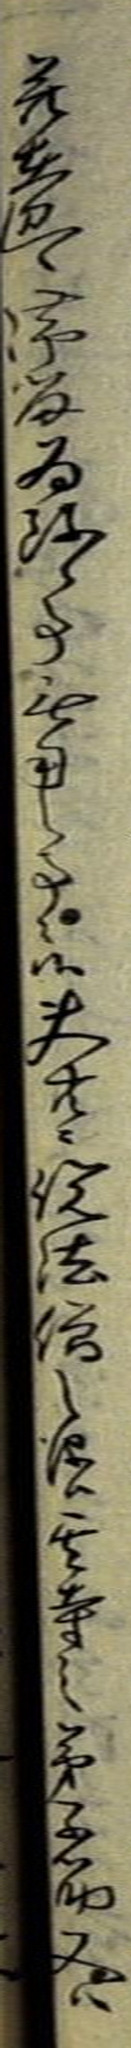并在辺へ滞留為致候事無用之事ニ候夫共ニ説法僧之儀ハ其寺之弟子筋又ハ
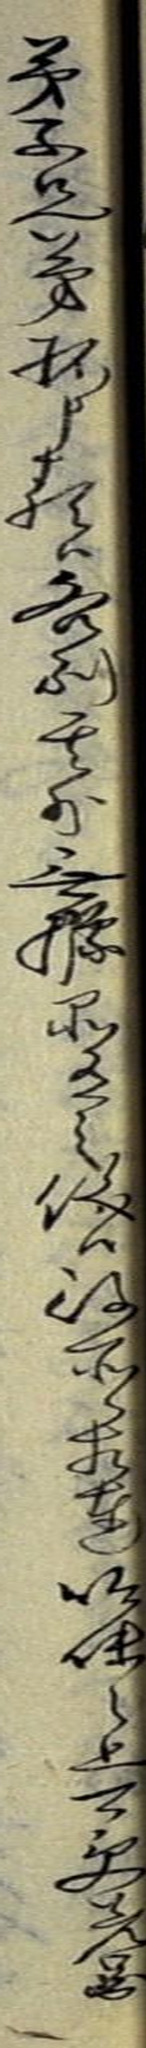弟子兄弟抔申類ハ各別其外無拠品有之儀ハ役所へ相達吟味之上可受差図
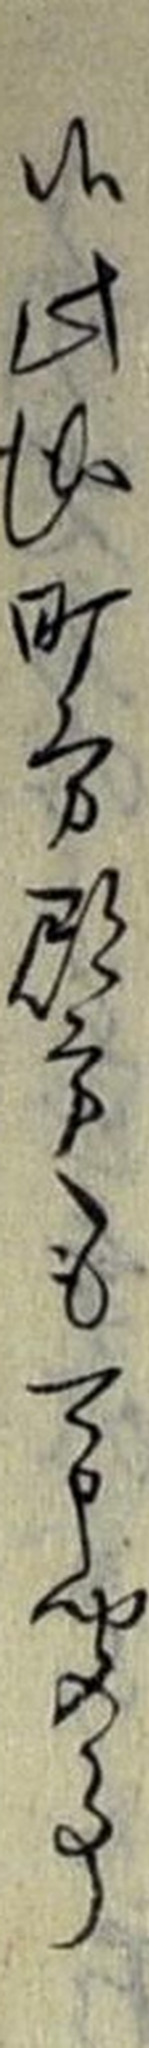候此趣町方郡方へも可申聞事
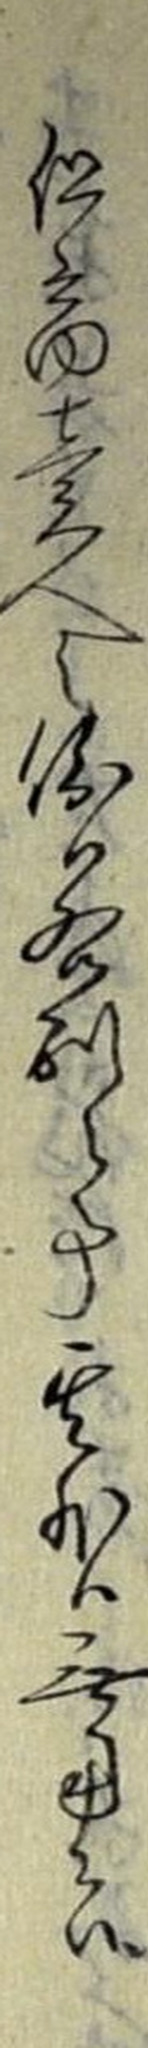但商売人之儀ハ各別之事其外ハ無用ニ候
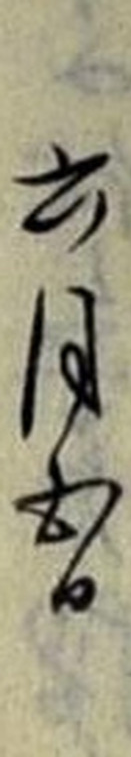六月五日
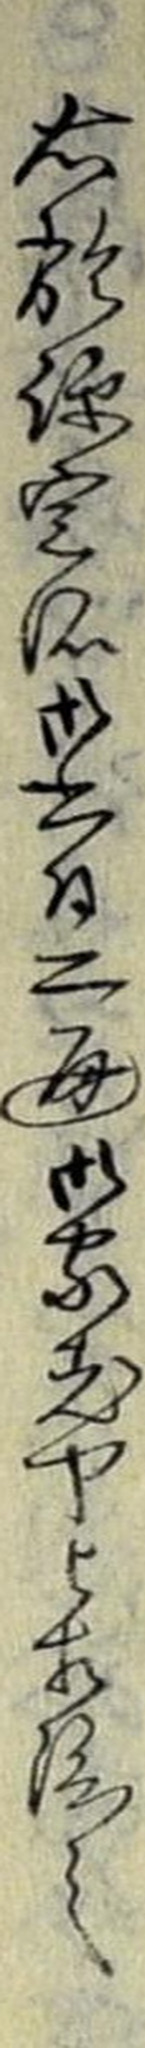右於評定所御書付二通御家老中被相渡之
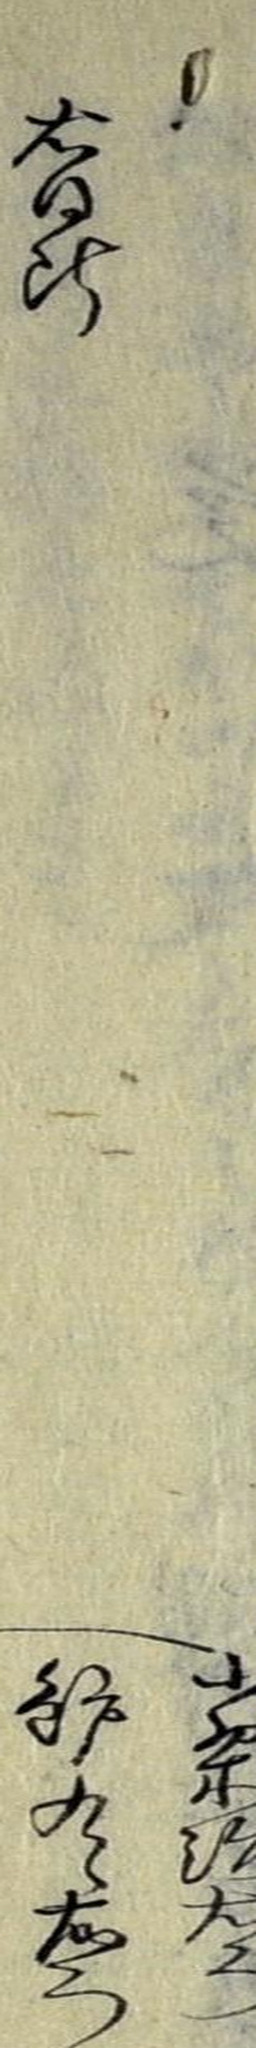右同断鱸九郎右衛門
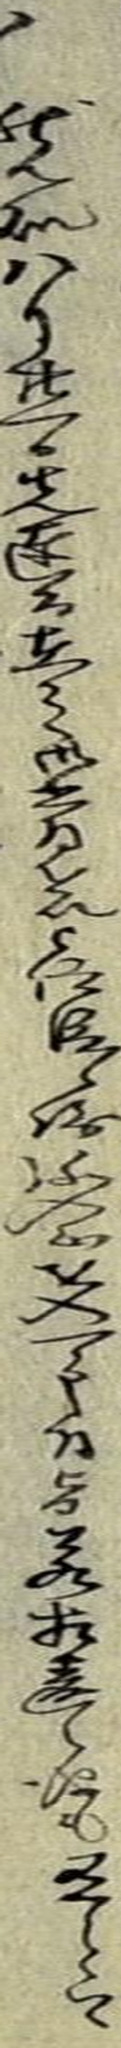〆然ル処八月廿一日先達而在々へ御書付を以被仰渡候儀弥念を入可申付旨若相違之儀も有之候ハヽ
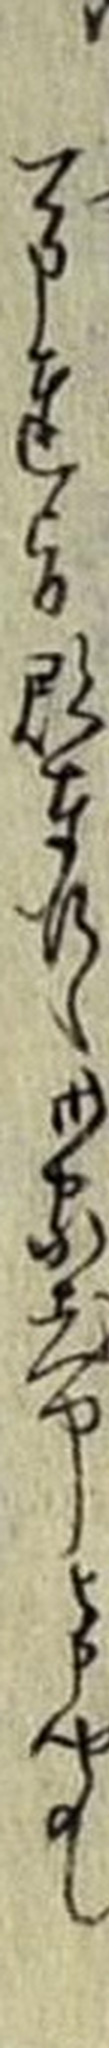可申達旨郡奉行へ御家老中被申聞候
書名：命令之部 一
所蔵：福井県文書館 Fukui Prefectural Archives
